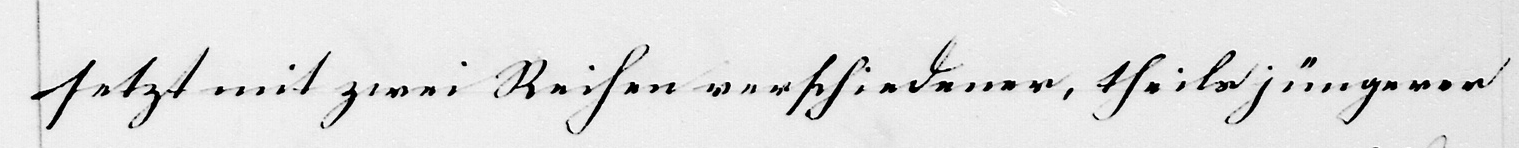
setzt mit zwei Reihen verschiedener, theils jüngerer
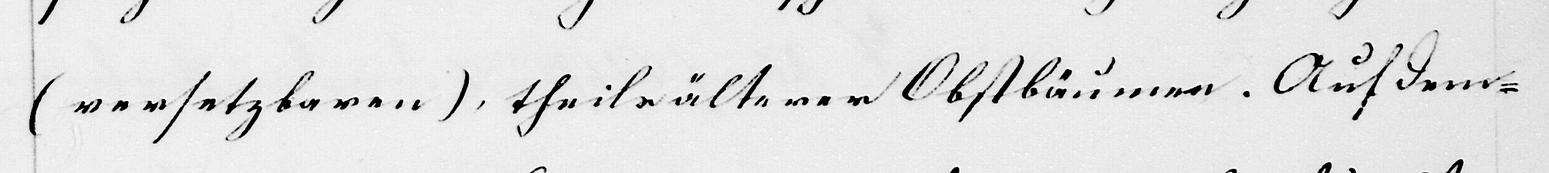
(versetzbaren), theils älterer Obstbäume. Auf dem¬
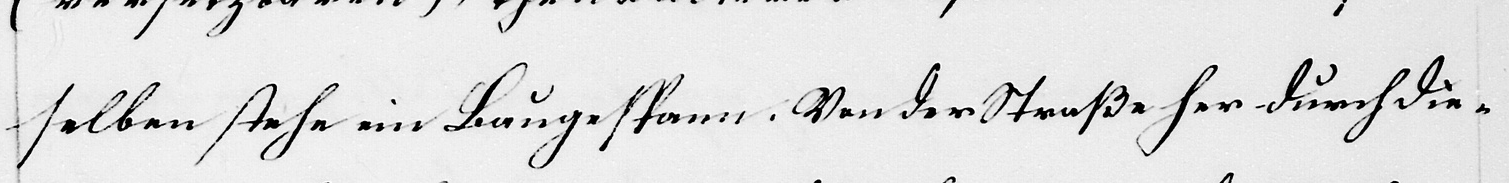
selben stehe ein Baugespann. Von der Straße her durch die¬
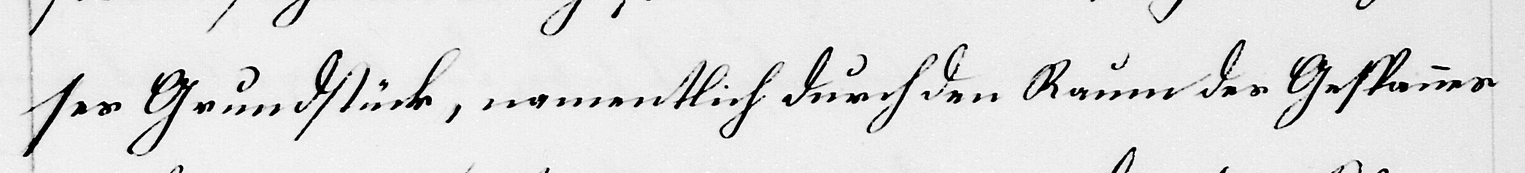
ses Grundstück, namentlich durch den Raum des Gespannes
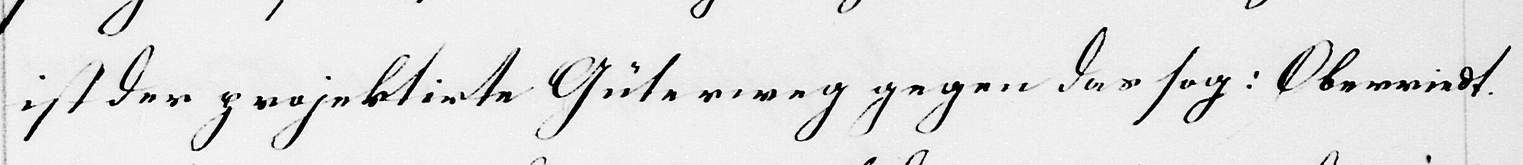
ist der projektirte Güterweg gegen das sog: Oberriedt
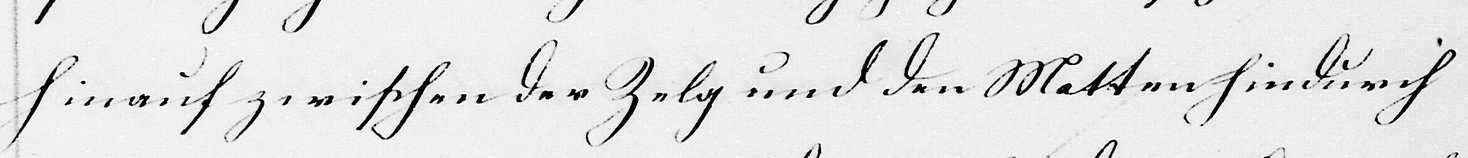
hinauf zwischen der Zelg und den Matten hindurch
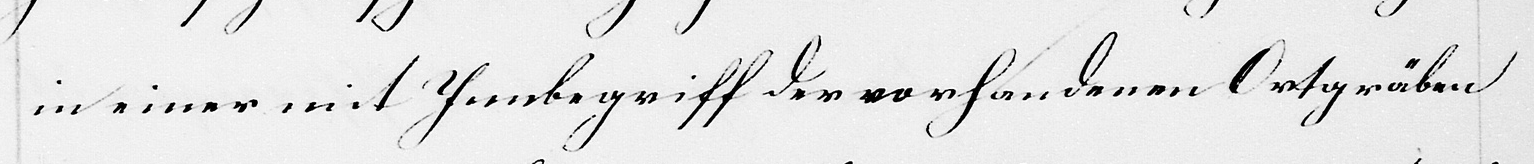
in einer mit Innbegriff der vorhandenen Ortgräben
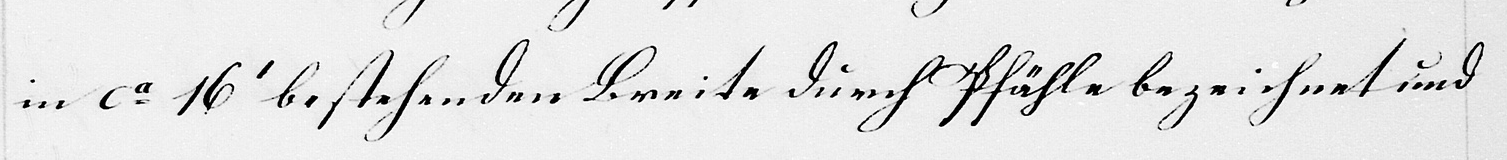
in ca 16 [Fuss] bestehenden Breite durch Pfähle bezeichnet und
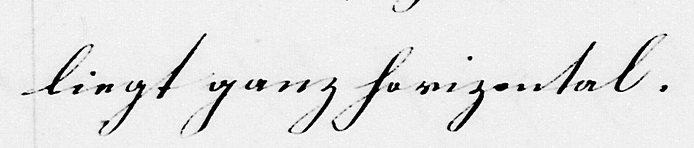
liegt ganz horizontal.
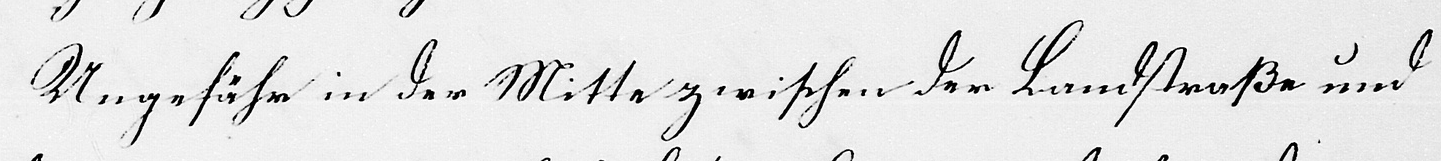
Ungefähr in der Mitte zwischen der Landstraße und
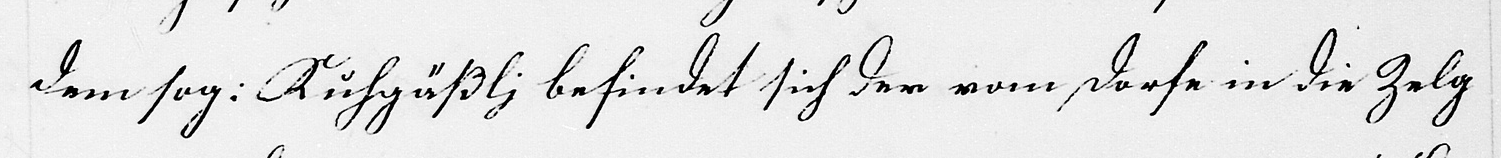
dem sog: Kuhgäßli befindet sich der vom Dorfe in die Zelg
